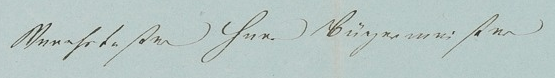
Verehrtester Herr Bürgermeister
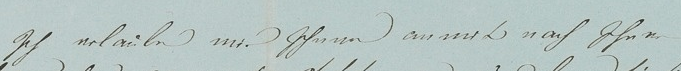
Ich erlaube mir Ihnen anmit nach Ihrer
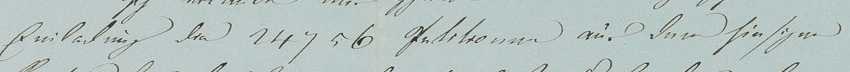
Einladung die 24756 Petitionen aus dem hiesigen
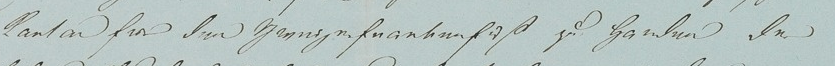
Kanton für den Schweizerfrankenfuß zu Handen der
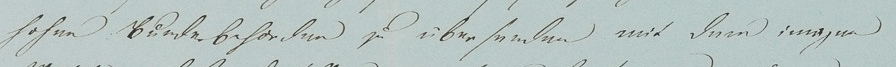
hohen Bundesbehörden zu übersenden mit dem innigen
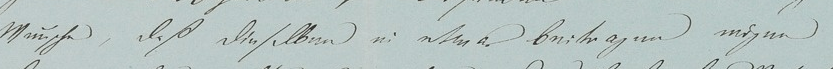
Wunsche, daß dieselben in etwas beitragen mögen
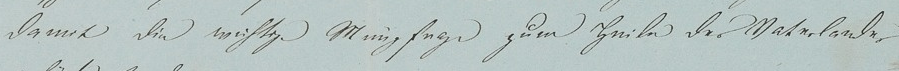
damit die wichtige Münzfrage zum Heile des Vaterlandes
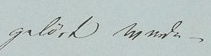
gelöst werde.
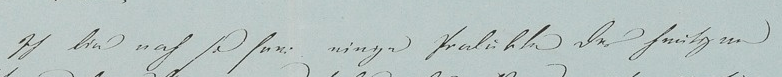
Ich bin noch so frei einige Produkte des heutigen
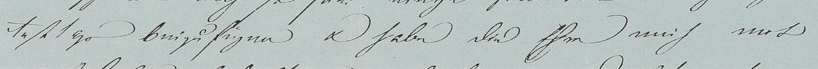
Festtags beizufügen u habe die Ehre mich mit
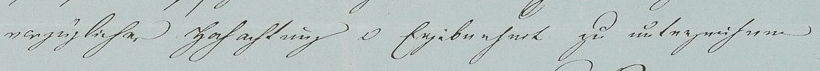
vorzüglicher Hochachtung u Ergebenheit zu unterzeichnen.
